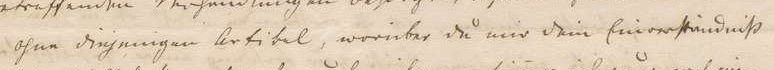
Ohne diejenigen Artikel, worüber Du mir Dein Einverständniß
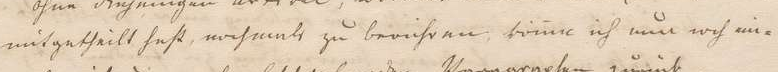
mitgetheilt hast, nochmals zu berühren, komme ich nun noch ein-
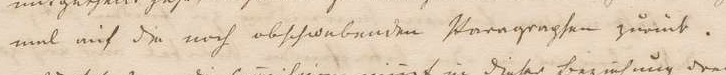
mal auf die noch obschwebenden Paragraphen zurück.
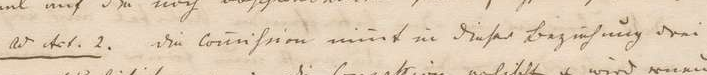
Ad Art. 2. Die Commißion nimmt in dieser Beziehung drei
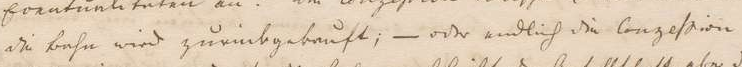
die Bahn wird zurückgekauft; – oder endlich die Conzession
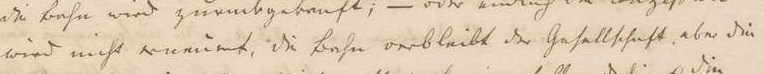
wird nicht erneuert, die Bahn verbleibt der Gesellschaft, aber die
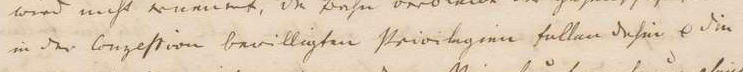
in der Conzession bewilligten Pivilegien fallen dahin & die
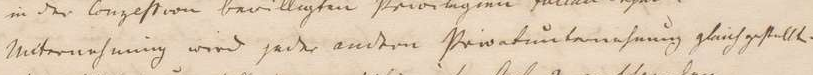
Unternehmung wird jeder andern Privatunternehmung gleichgestellt.
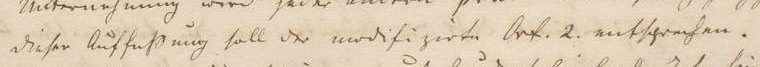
DIeser Auffaßung soll der modifizirte Art. 2. entsprechen.
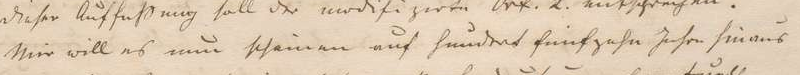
Mir will es nun scheinen auf hundert fünfzehn Jahre hinaus
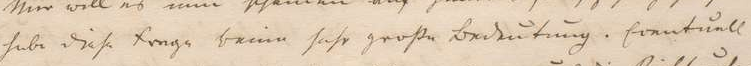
habe diese Frage keine sehr große Bedeutung. Eventuell
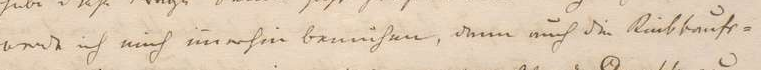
werde ich mich immerhin bemühen, dann auch die Rückkaufs-
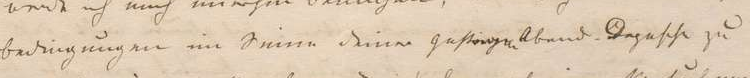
bedingungen im Sinne Deiner gestrigen Abend-Depesche zu
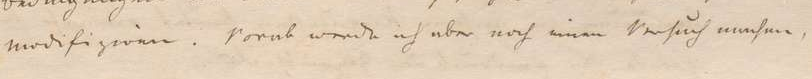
modifiziren. Vorab werde ich aber noch einen Versuch machen,
